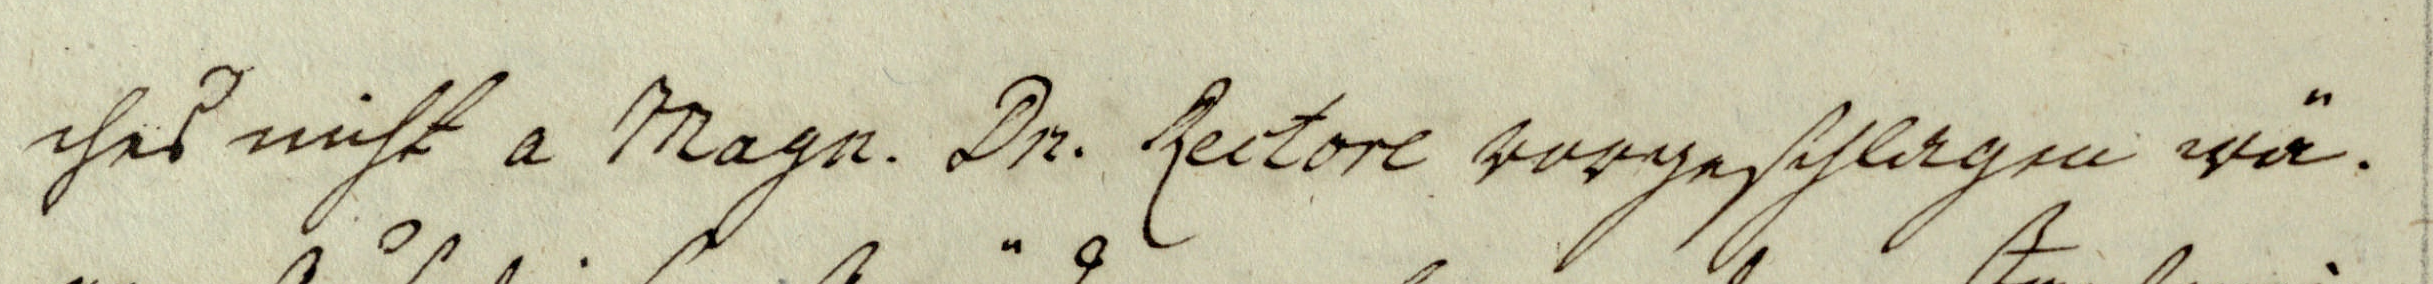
ches nicht a Magn. Dn. Rectore vorgeschlagen wä¬
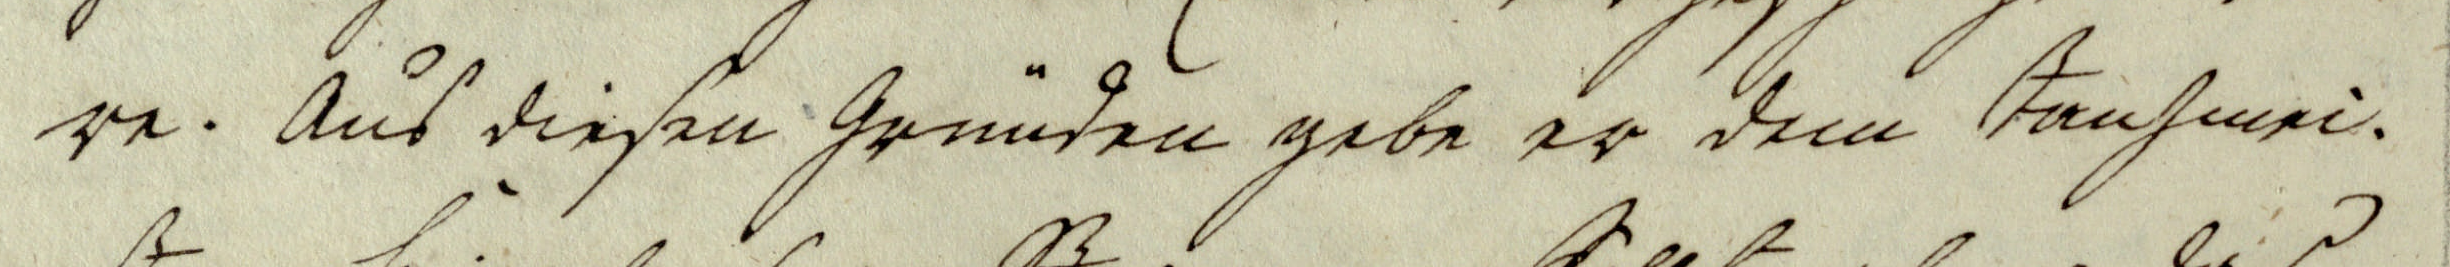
re. Aus diesen Gründen gebe er dem Tanzmei¬
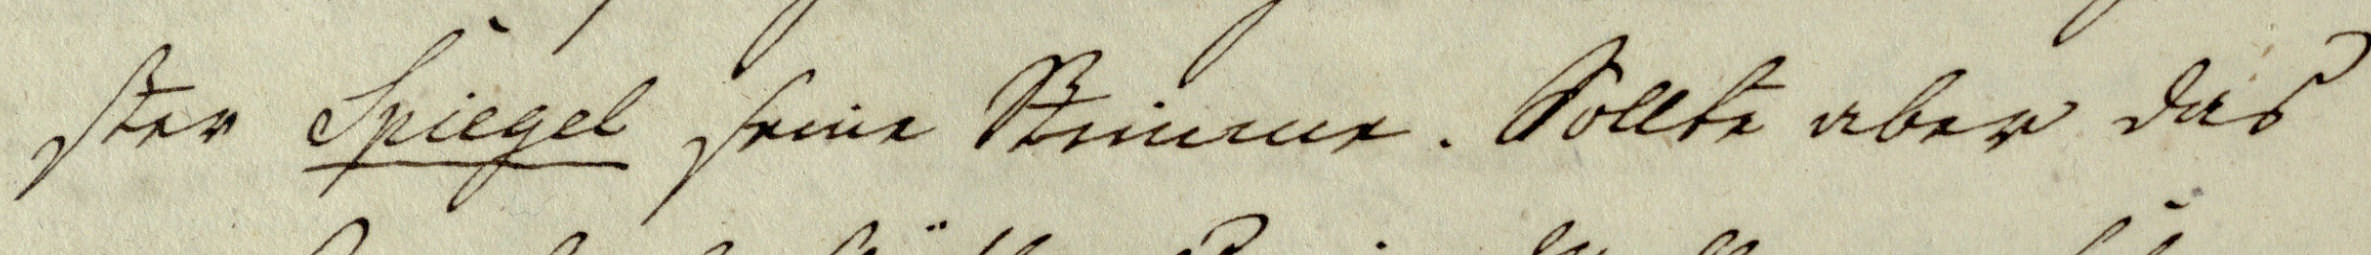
ster Spiegel seine Stimme. Sollte aber das
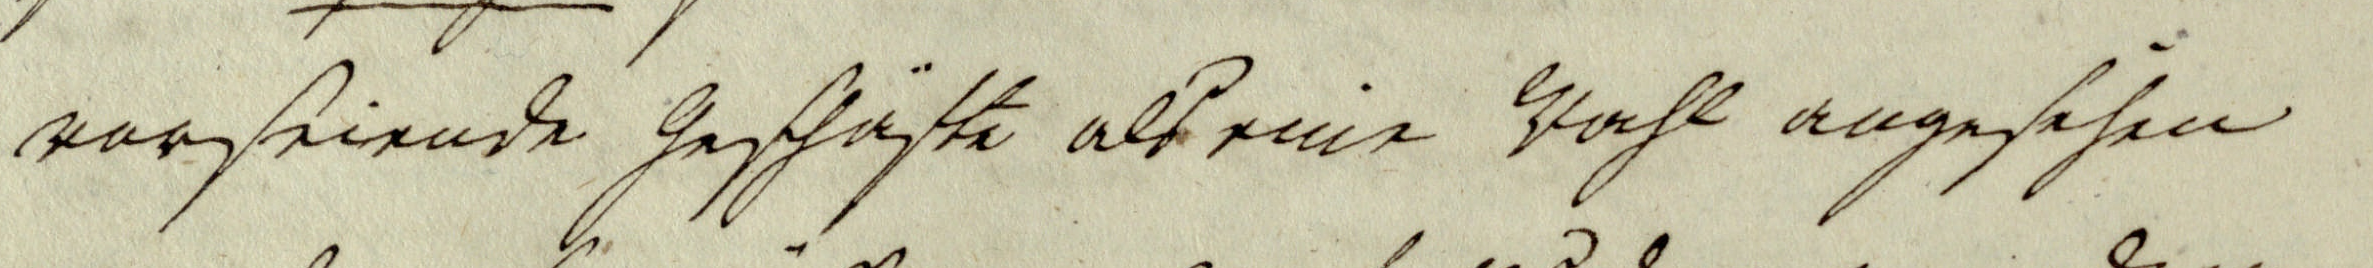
vorseiende Geschäfte als eine Wahl angesehen
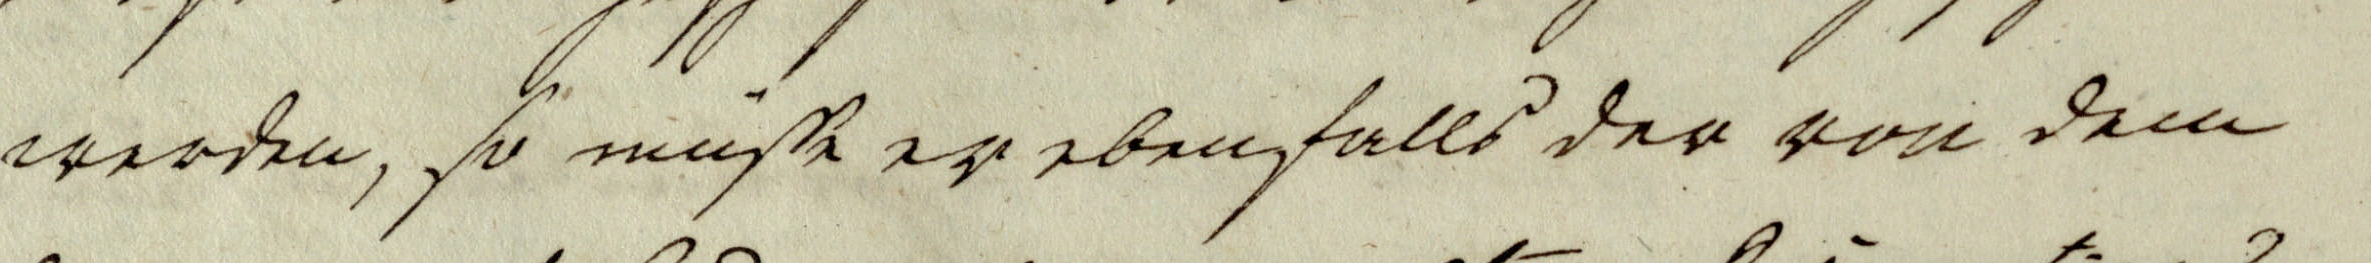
werden, so müsse er ebenfalls der von dem
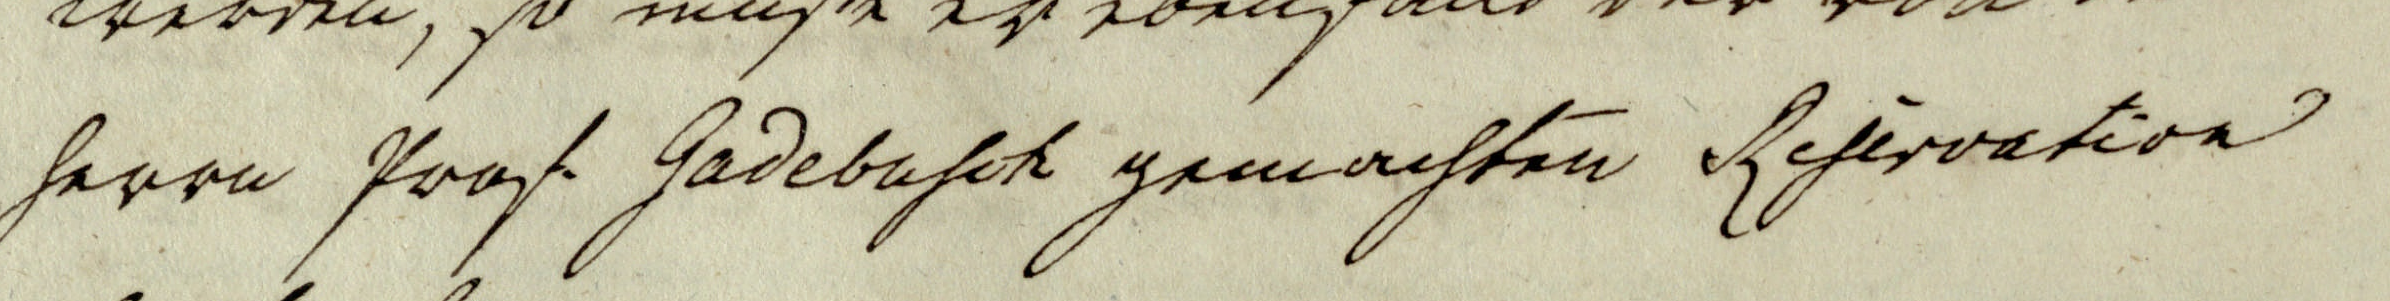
Herrn Prof. Gadebusch gemachten Reservation
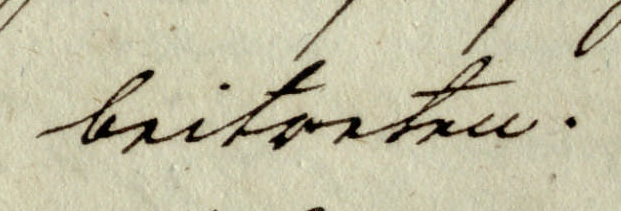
beitreten.
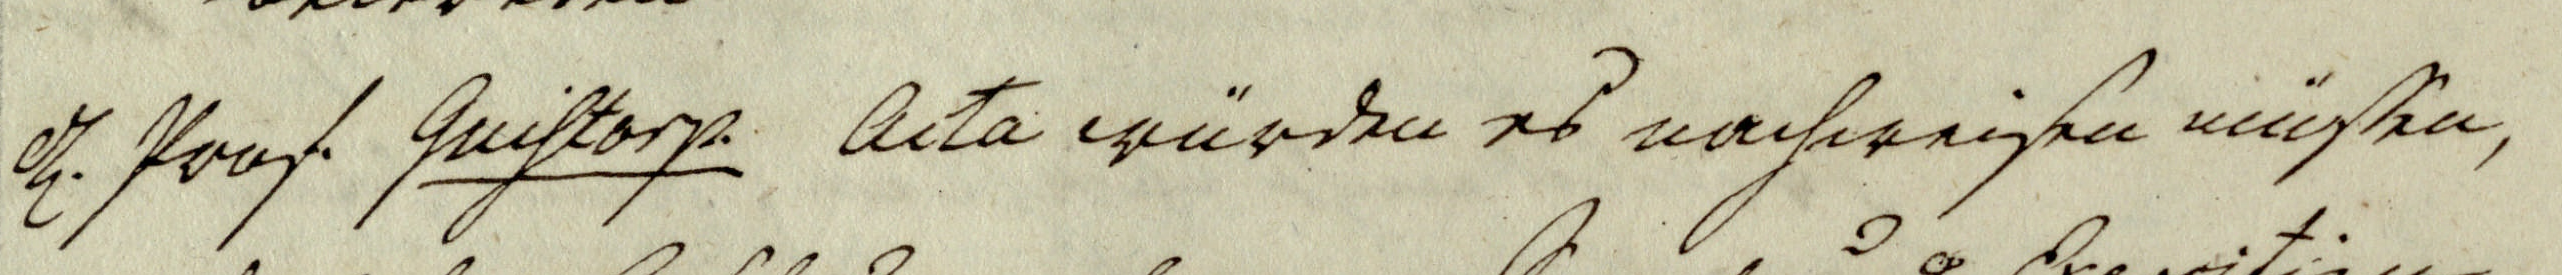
dh. Prof. Quistorp. Acta würden es nachweisen müssen,
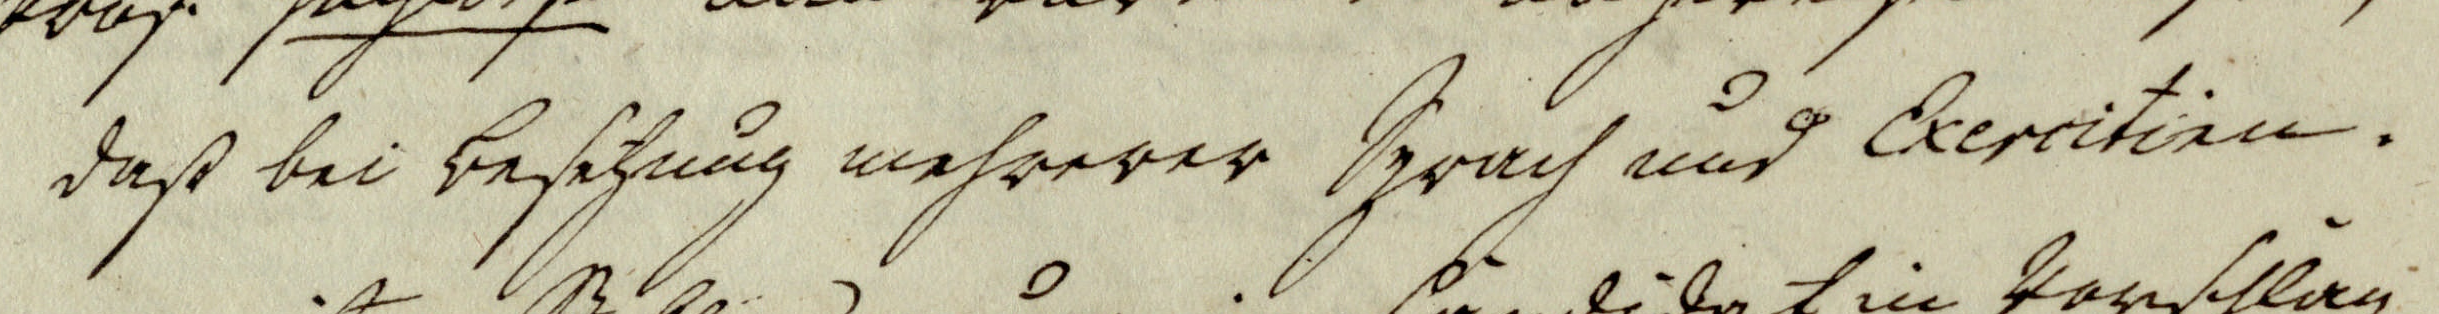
daß bei Besetzung mehrerer Sprach und Exercitien¬
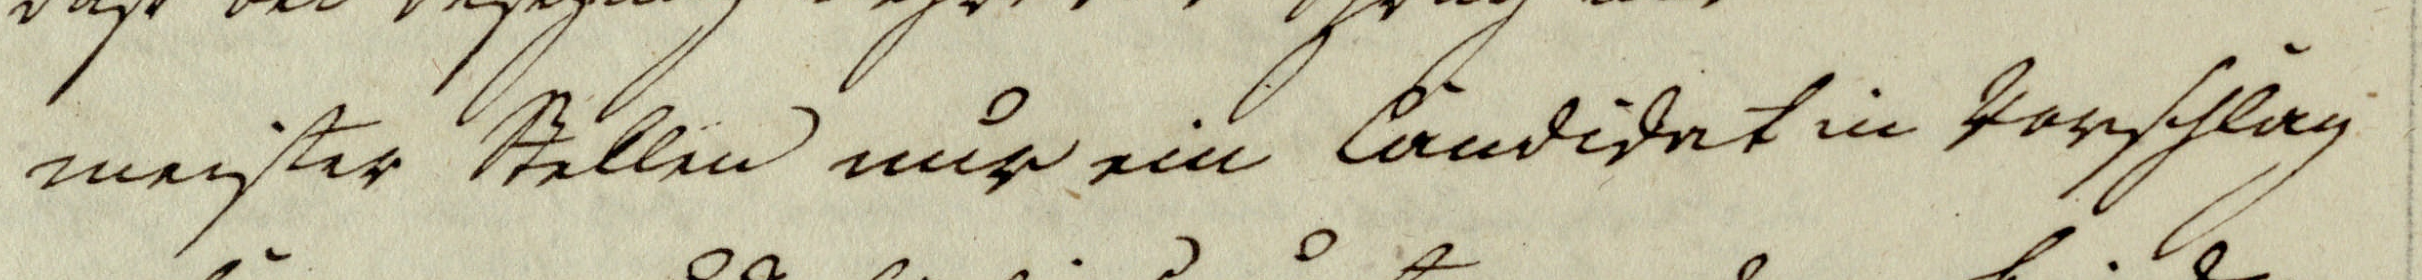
meister Stellen nur ein Candidat in Vorschlag
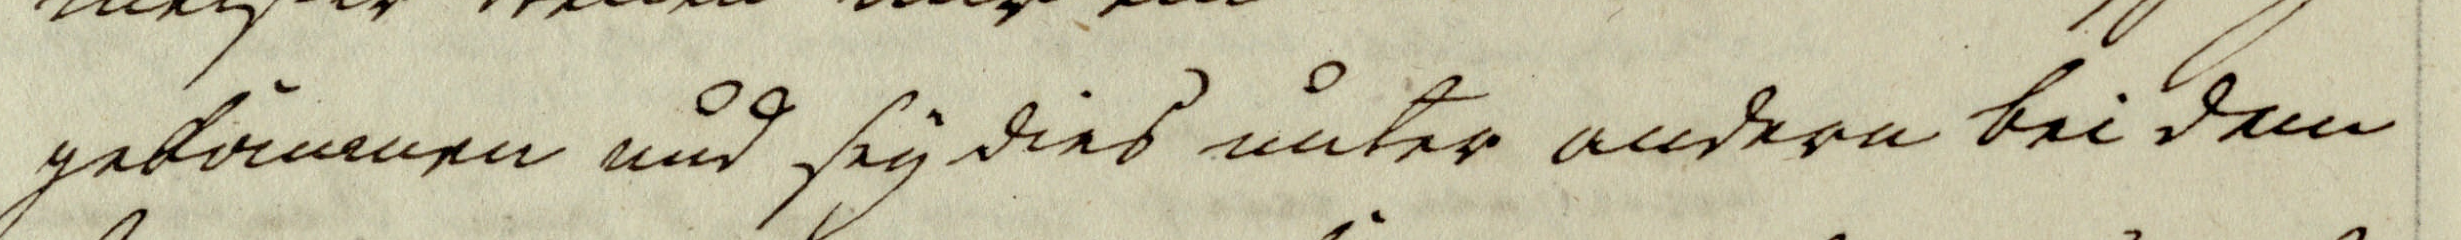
gekommen und seÿ dies unter andern bei dem
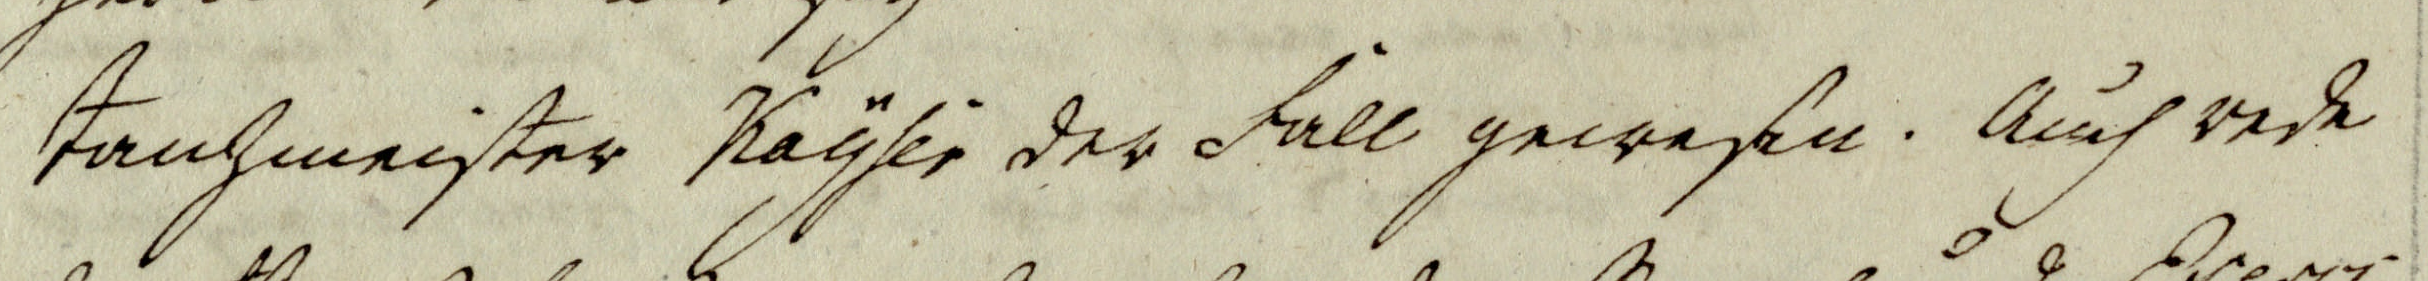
Tanzmeister Kaÿser der Fall gewesen. Auch rede
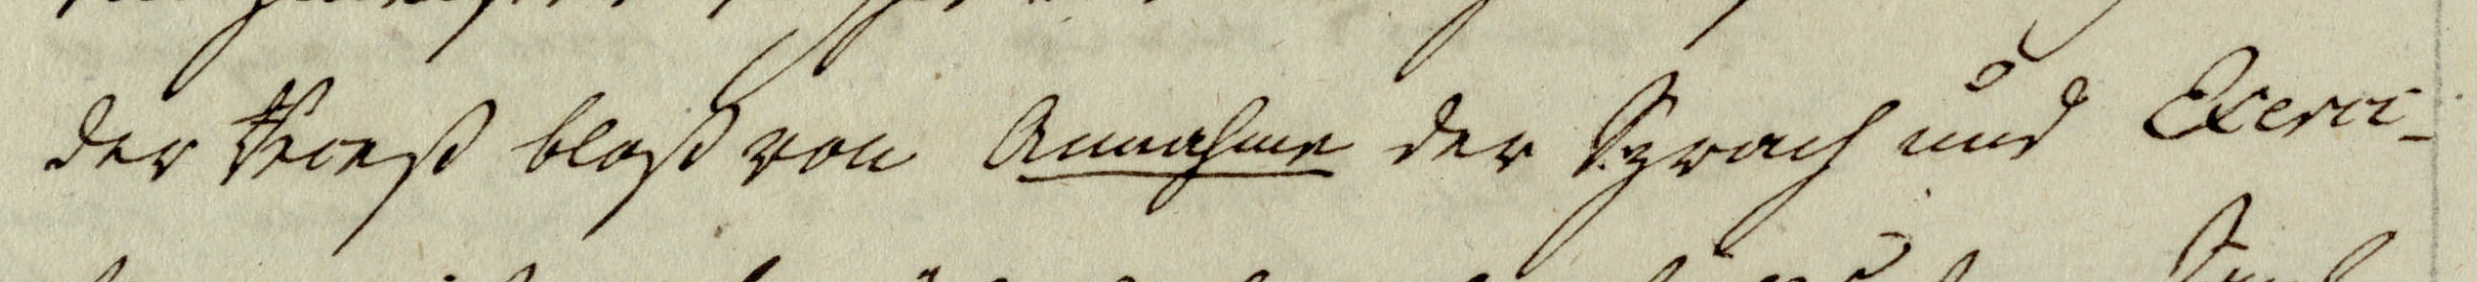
der Receß bloß von Annahme der Sprach und Exerci¬
